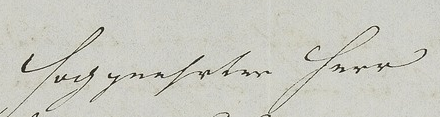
Hochgeehrter Herr
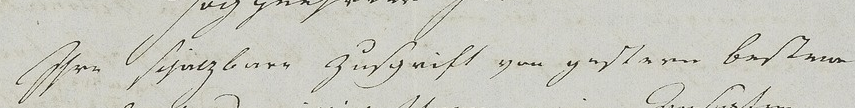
Ihre schätzbare Zuschrift von gestern bestens
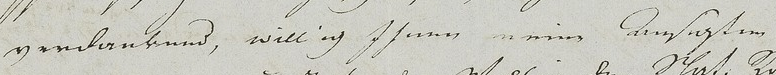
verdankend, will ich Ihnen meine Ansichten
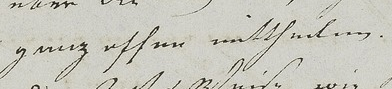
ganz offen mittheilen.
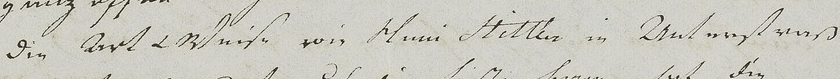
Die Art & Weise wie Hüni Stettler in Unterstraß
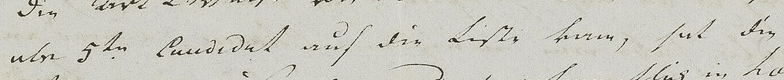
als 5ter Candidat auf die Liste kam, hat die
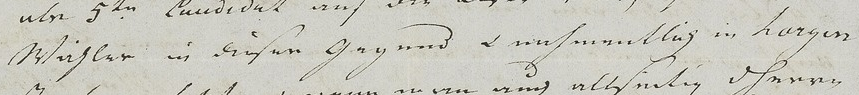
Wähler in dieser Gegend & nahmentlich in Horgen
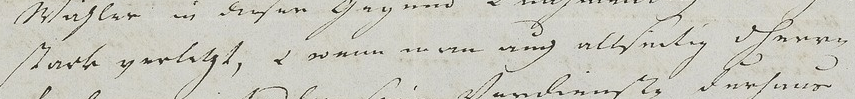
stark verletzt, & wenn man auch allseitig Herrn
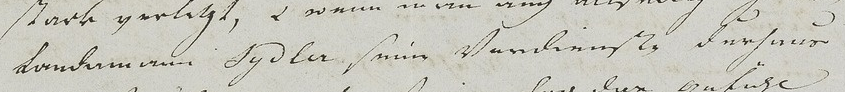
Landamann Sydler seine Verdienste durchaus
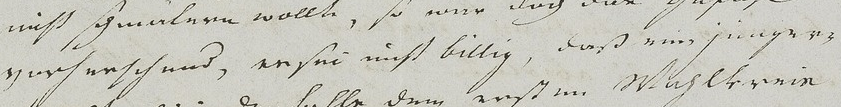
vorherschend, es sei nicht billig, daß eine jüngere
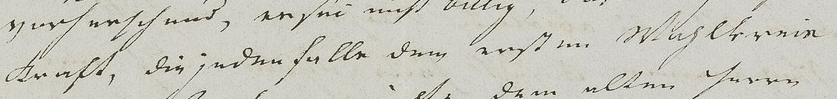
Kraft, die jedenfalls dem ersten Wahlkreis
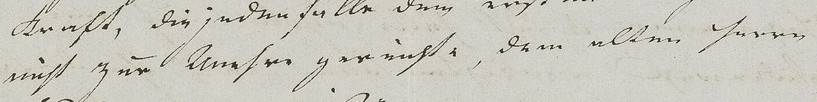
nicht zur Unehre gereichte, dem alten Herrn
